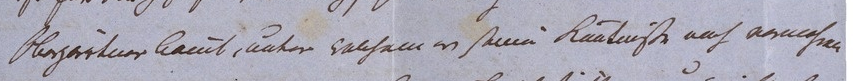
Obergärtner kommt, unter welchem er seine Kenntniße noch vermehren
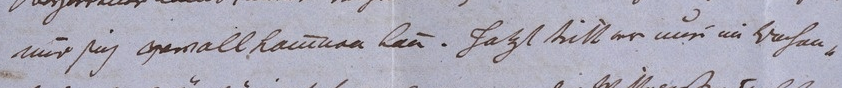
und sich vervollkommnen kann. Jetzt tritt er nur im Wochen-
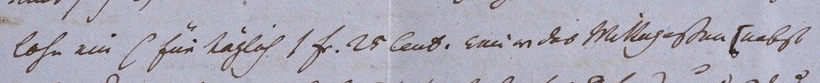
lohn ein (für täglich 1 Fr. 25 Cent, wenn er das Mittageßen (nebst
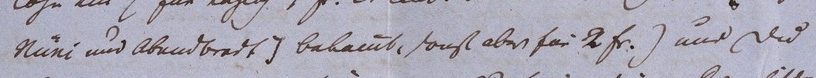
Nüni und Abendbrodt) bekommt, sonst aber für 2 Fr.) und Du
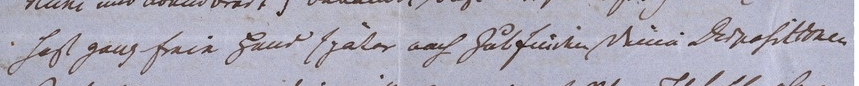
hast ganz freie Hand später nach Gutfinden Deine Dispositionen
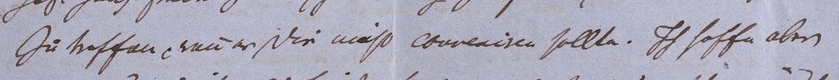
zu treffen, wenn er dir nicht conveniren sollte. Ich hoffe aber
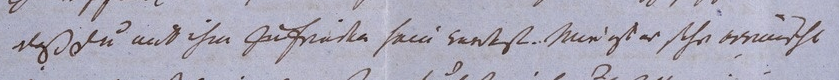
daß Du mit ihm zufrieden sein werdest. Mir ist es sehr erwünscht
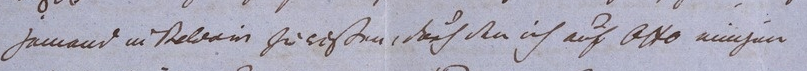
jemand in Belvoir zu wißen, durch den ich auf Otto einigen
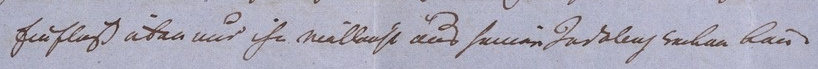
Einfluß üben und ihn vielleicht aus seiner Indolenz wecken kann.
